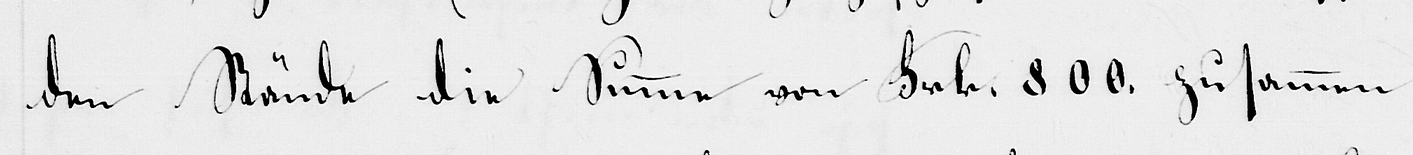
den Stände die Summe von Frk. 800. zusammen
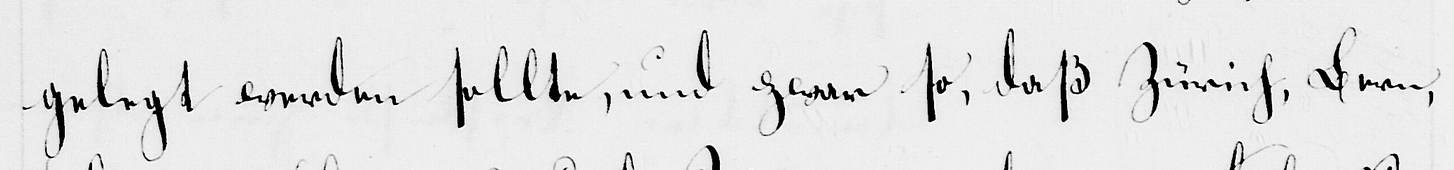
gelegt werden sollte, und zwar so, daß Zürich, Bern,
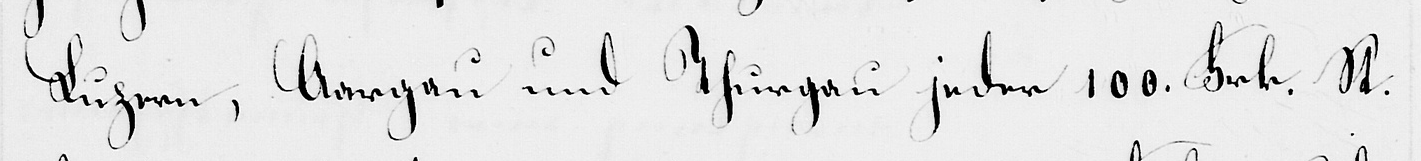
Luzern, Aargau und Thurgau jeder 100. Frk. St.
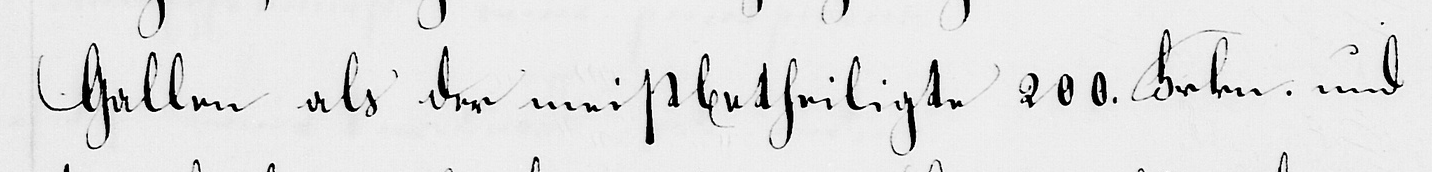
Gallen als der meistbetheiligte 200. Frkn. und
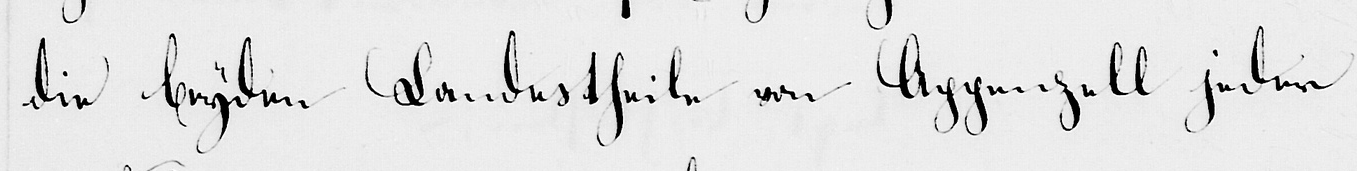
die beyden Landestheile von Appenzell jeder
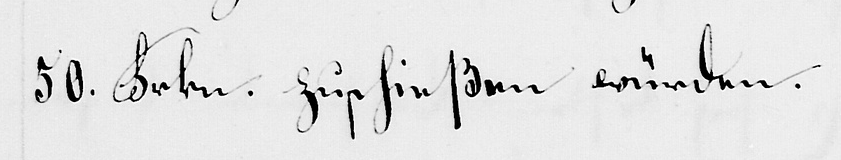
50. Frkn. zuschießen würden.
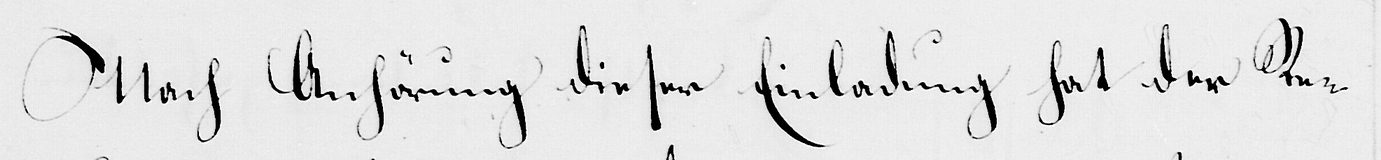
Nach Anhörung dieser Einladung hat der Re¬
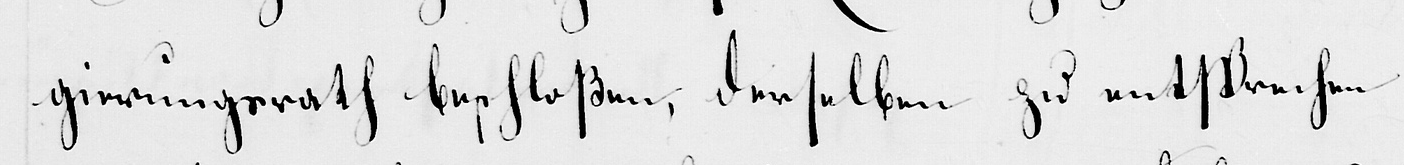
gierungsrath beschloßen, derselben zu entsprechen
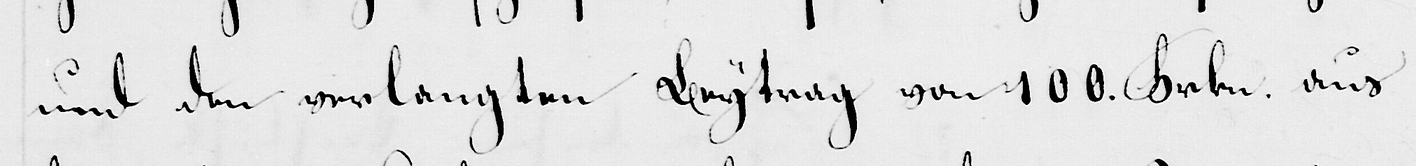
und den verlangten Beytrag von 100. Frkn. aus
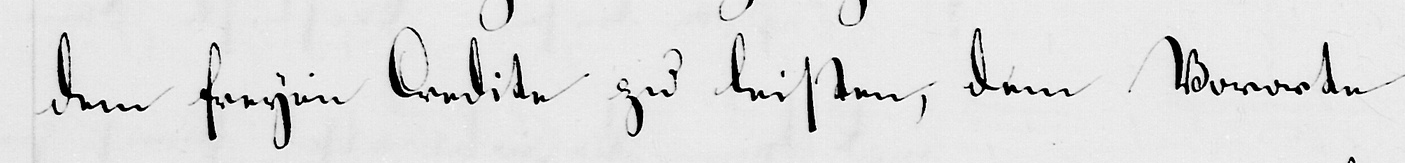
dem freyen Credite zu leisten, dem Vororte
